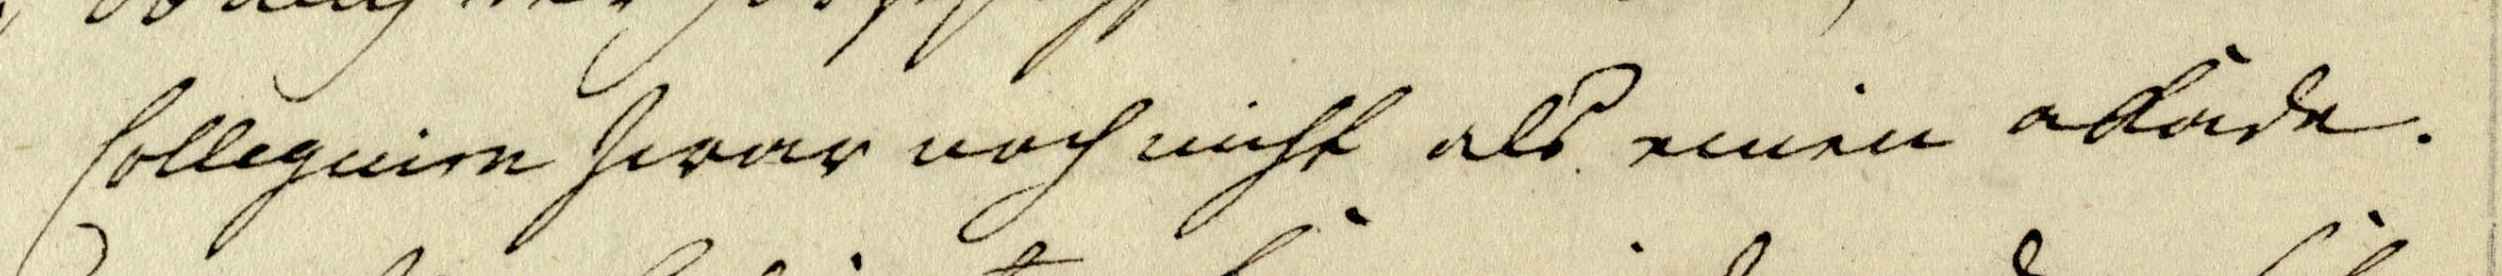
Collegium zwar noch nicht als einen akade¬
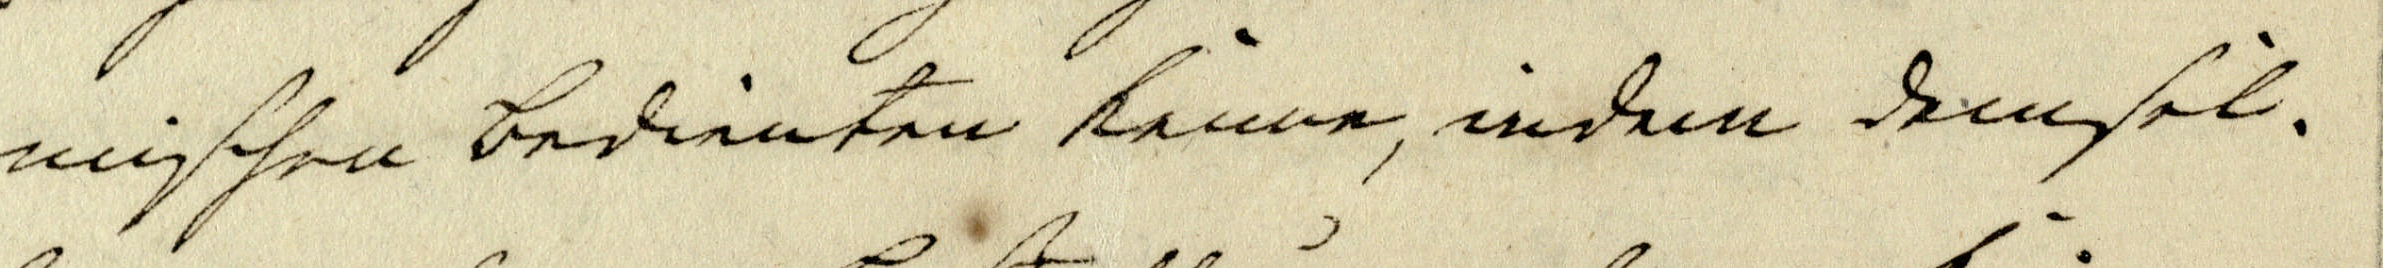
mischen Bedienten kenne, indem demsel¬
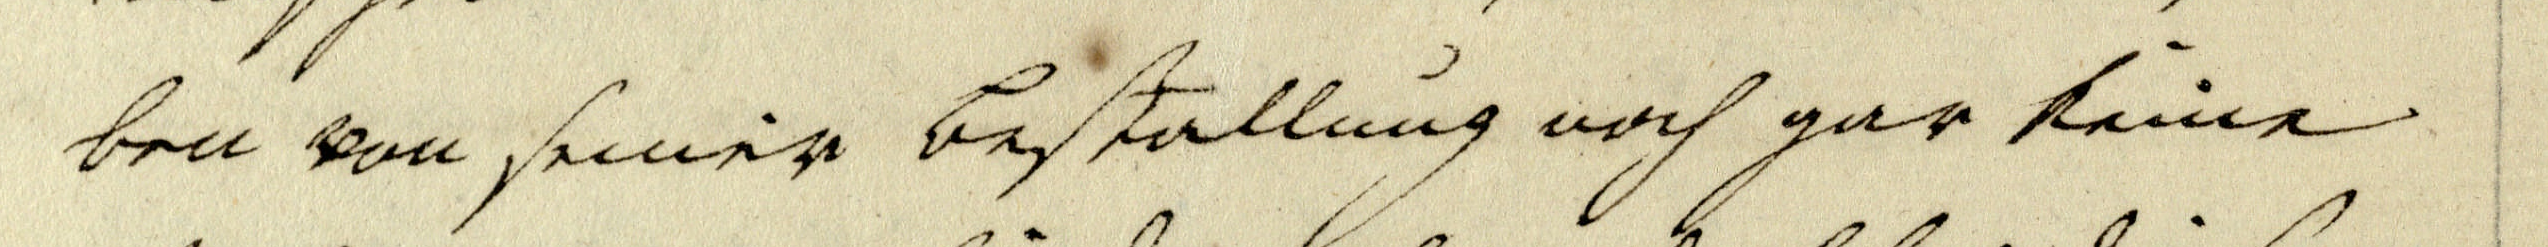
ben von seiner Bestallung noch gar keine
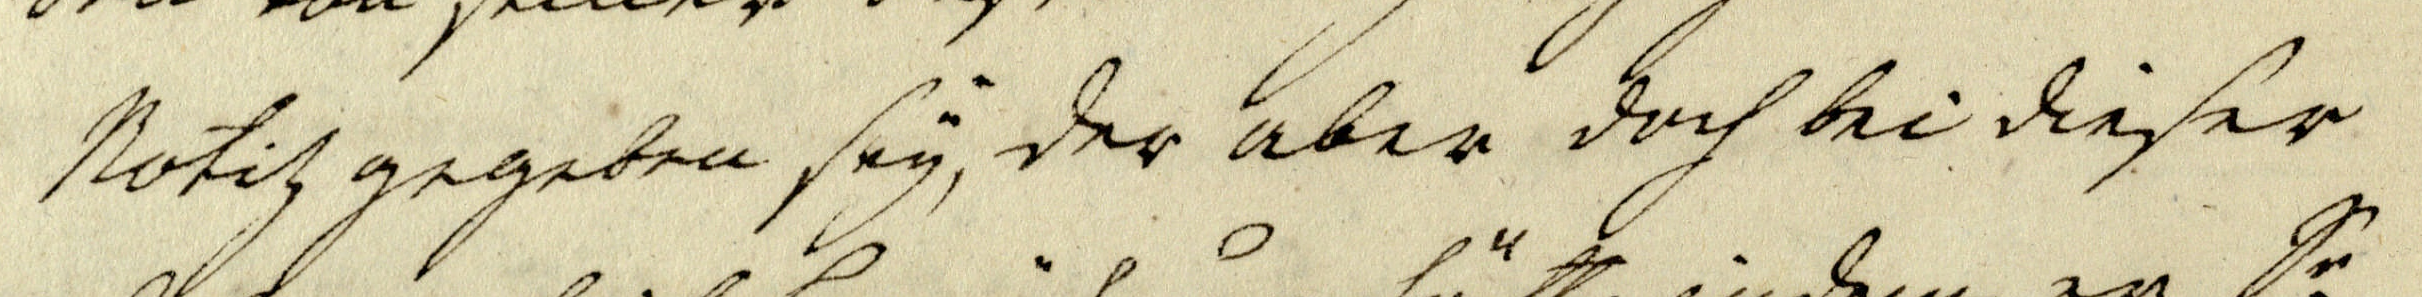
Notiz gegeben seÿ, der aber doch bei dieser
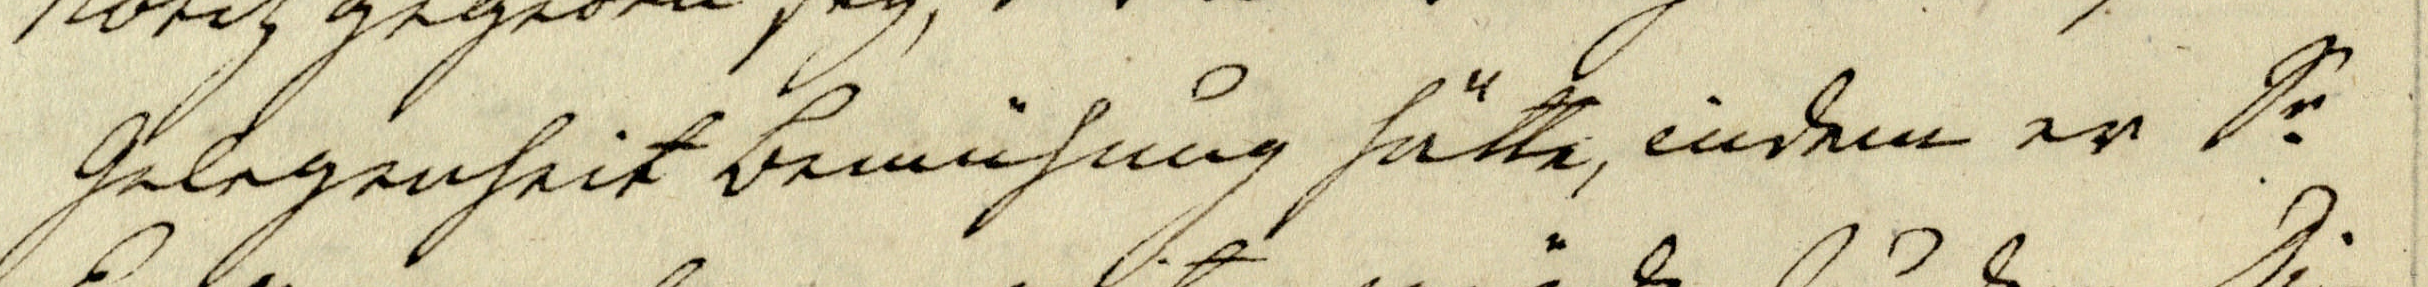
Gelegenheit Bemühung hätte, indem er Sr.
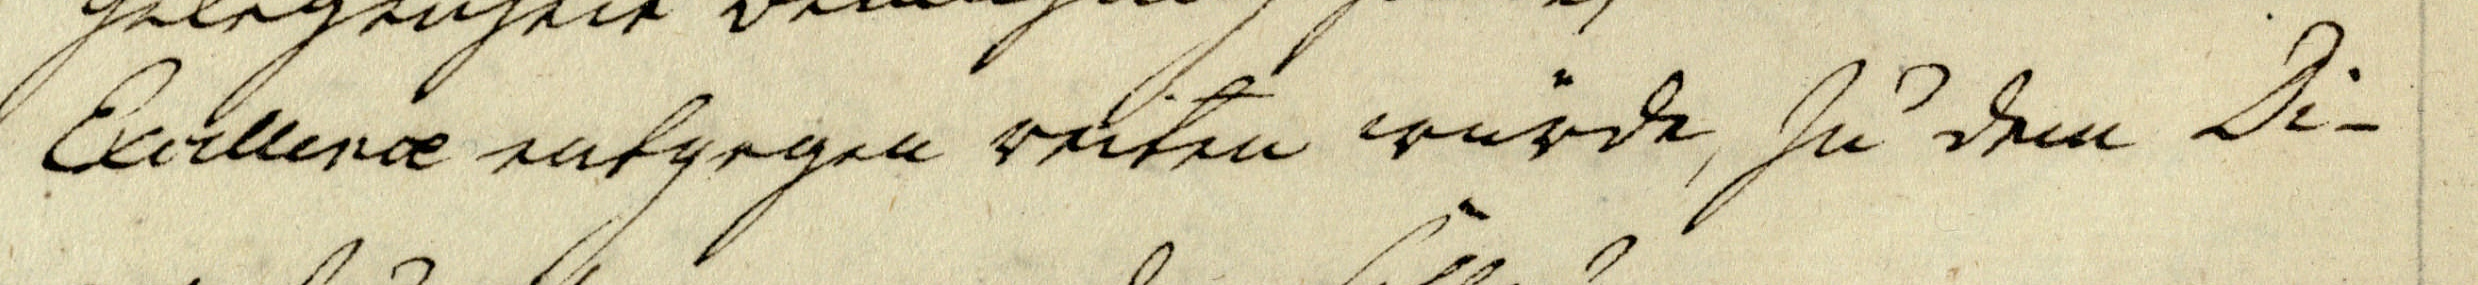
Excellence entgegen reiten würde, zu dem Di¬
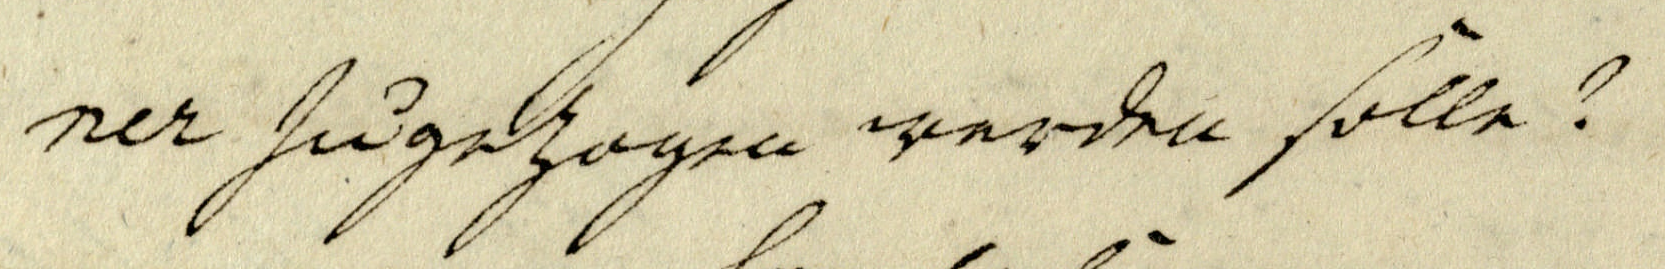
ner zugezogen werden solle?
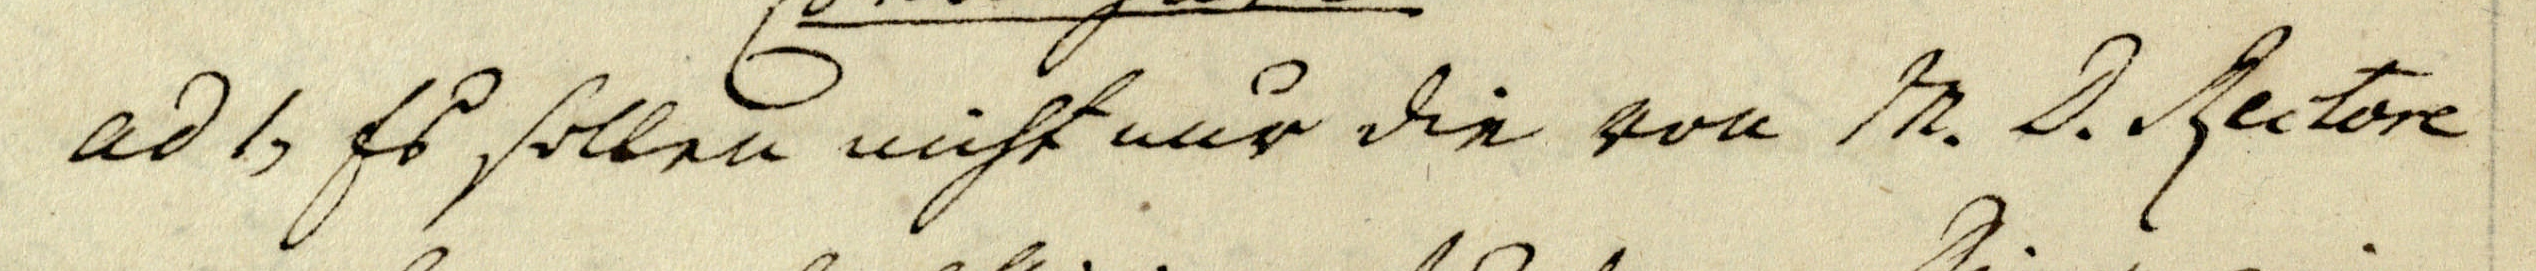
ad 1., Es sollen nicht nur die von M. D. Rectore
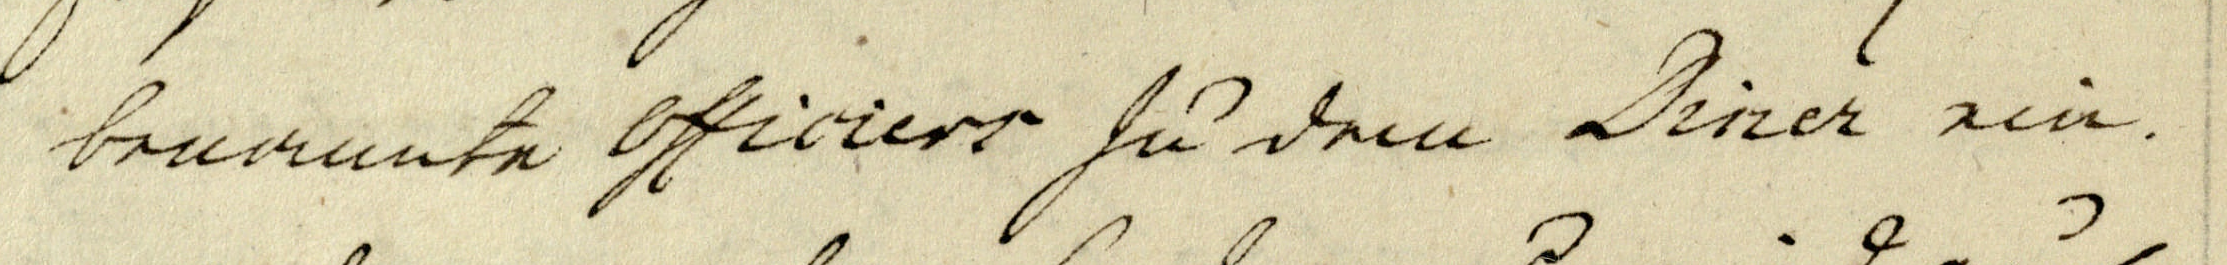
benannte Officiers zu dem Diner ein¬
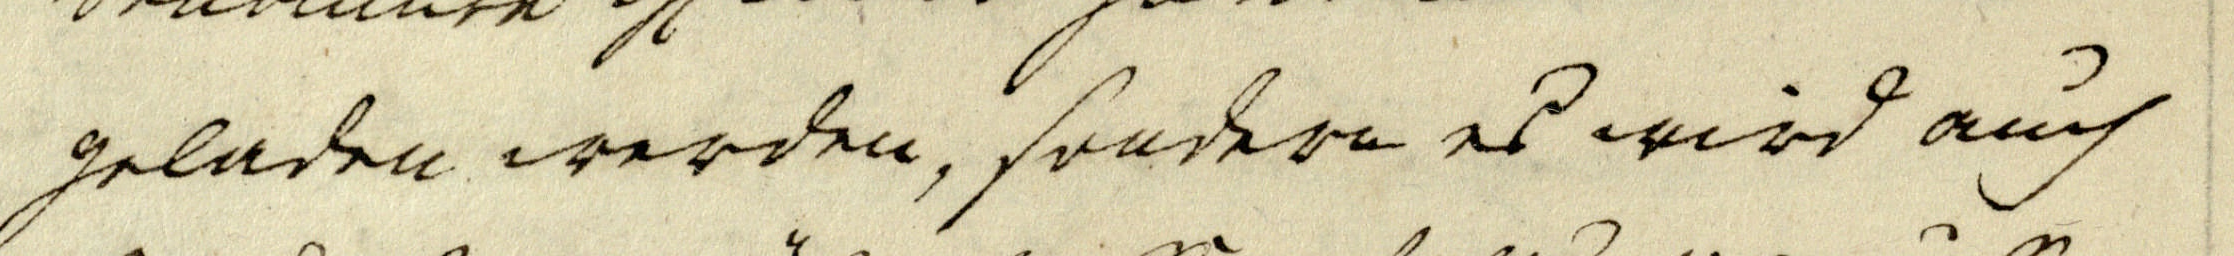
geladen werden, sondern es wird auch
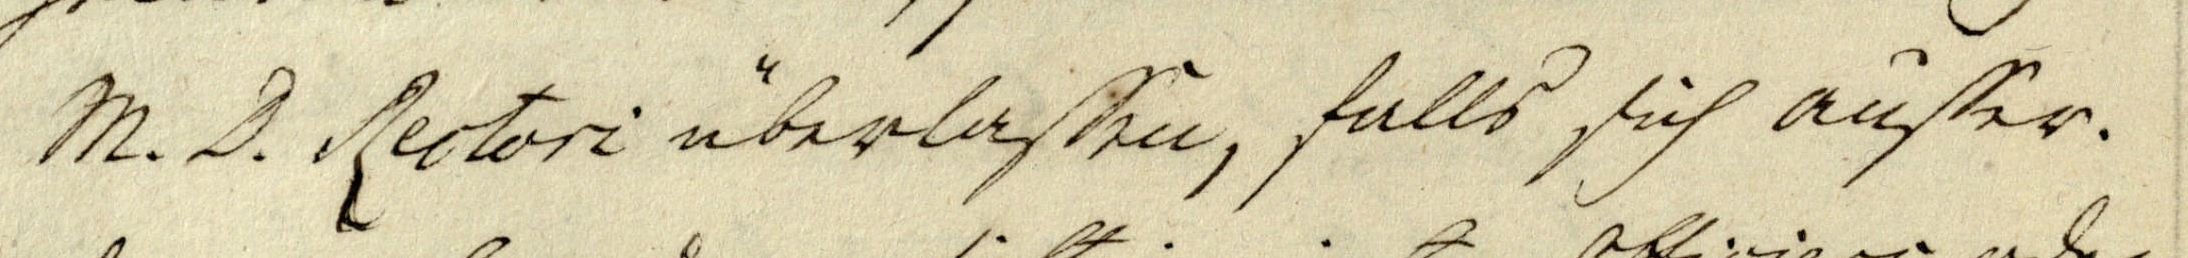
M. D. Rectori überlassen, falls sich ausser¬
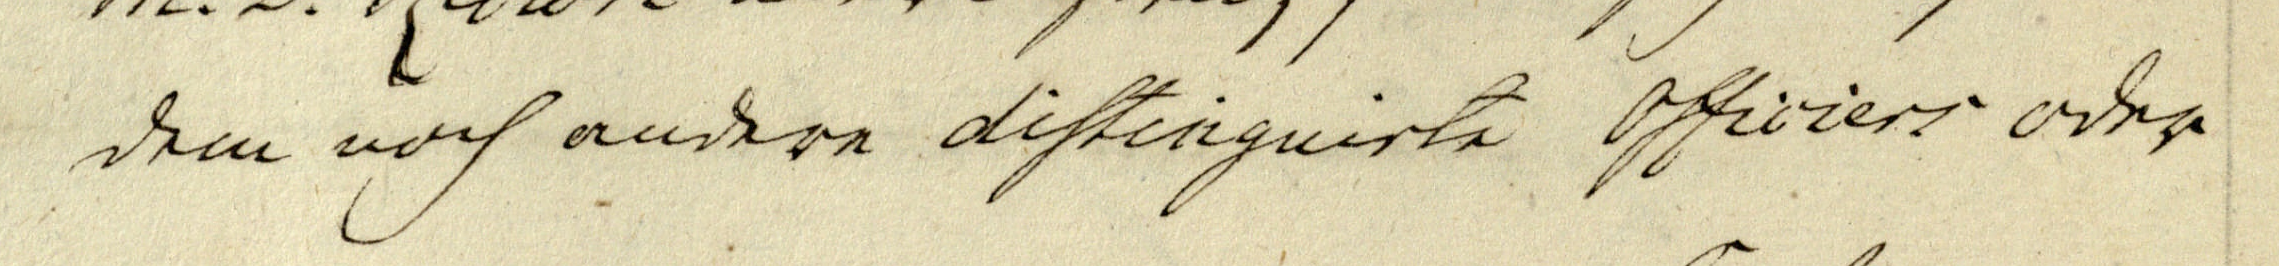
dem noch andere distinguirte Officiers oder
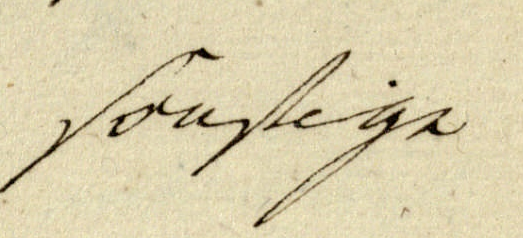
sonstige
